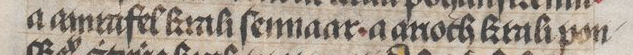a amrafel krali ſemnaar.a arioch krali pō
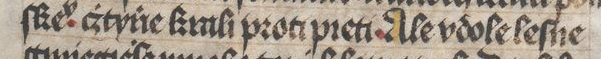ſkev cżtyṙie krali proti pieti.Ale y dole leſne
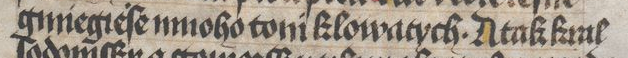gmiegieẛe mnoho toni klowatych.Atak kral
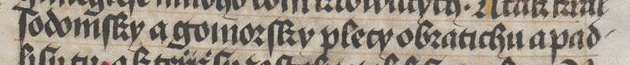ſodomſky a gomorſky plecy obratichu a pad¬
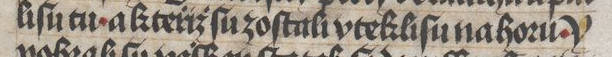li ſu tu.a kteṙíż ſu zoſtali ytekliſu na horu.Y
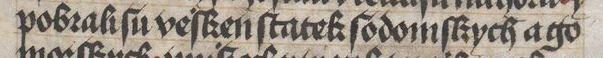pobrali ſu veẛken ſtatek ſodomſkych a geo
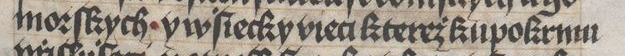morſkych.y wẛiecky vieci ktereż kupokrmu
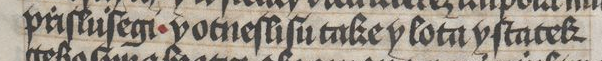pṙiſluẛegi.y otneſli ſu take y lota y ſtatek
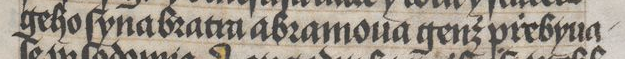geho ſyna bratra abramoua genż pṙebyua¬
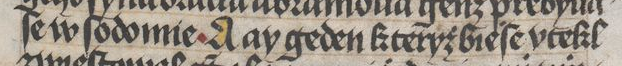ſe w ſodomie.A ay geden kteryż bieẛe vtekl
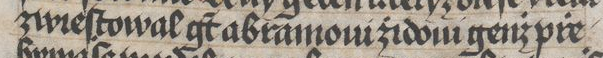zwieſtowal ḡt abramoui żidoui genż pṙe¬
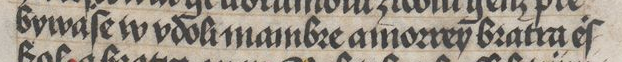bywaẛe w vdoli mambre a mozrey bratra eẛ¬
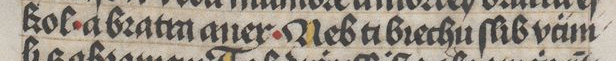kol.a bratra aner.Neb ti bíechu ſlib vċiní
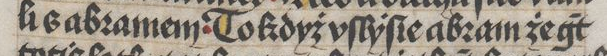li s abraníem.To kdyż vſlyẛíe abram że ḡt
